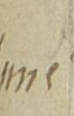June
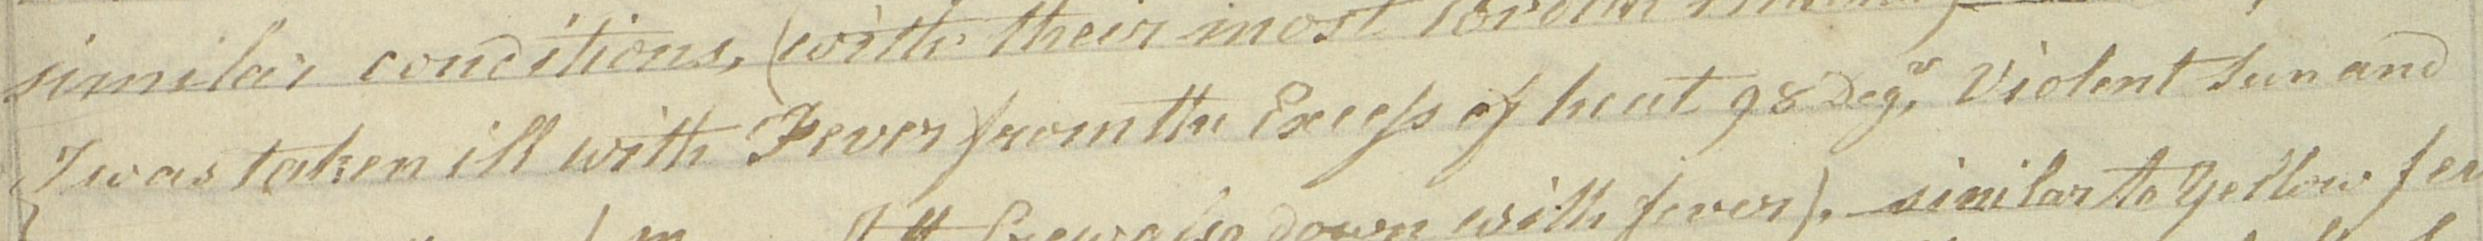I was taken ill with Fever) from the Excess of heat 98 deg^e. Violent sun and
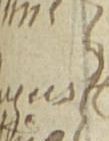August
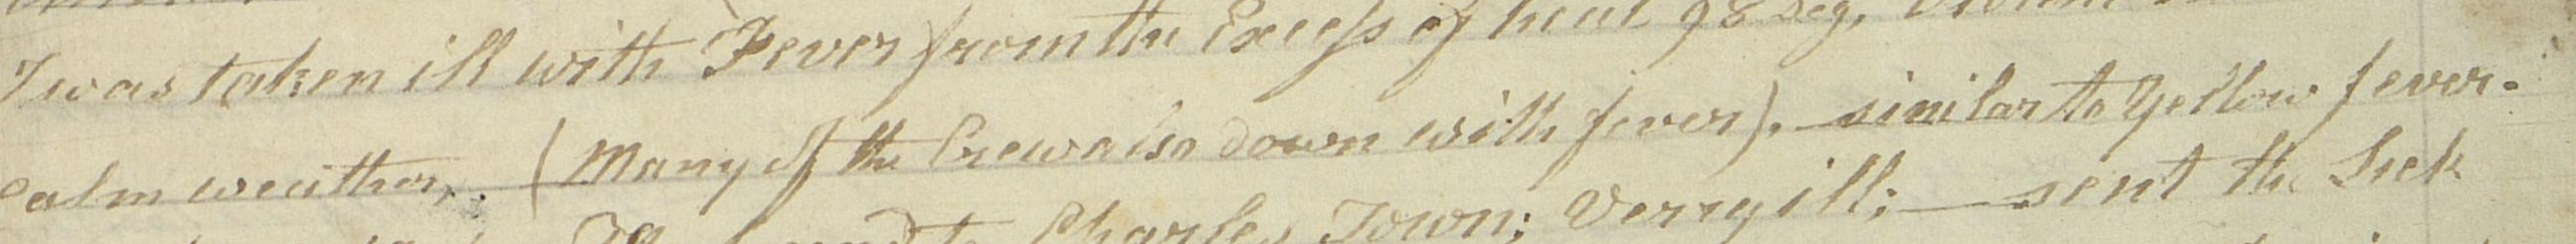calm weather, (Many of the Crew also down with fever). since to yellow fever.
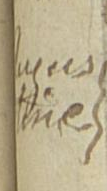tine
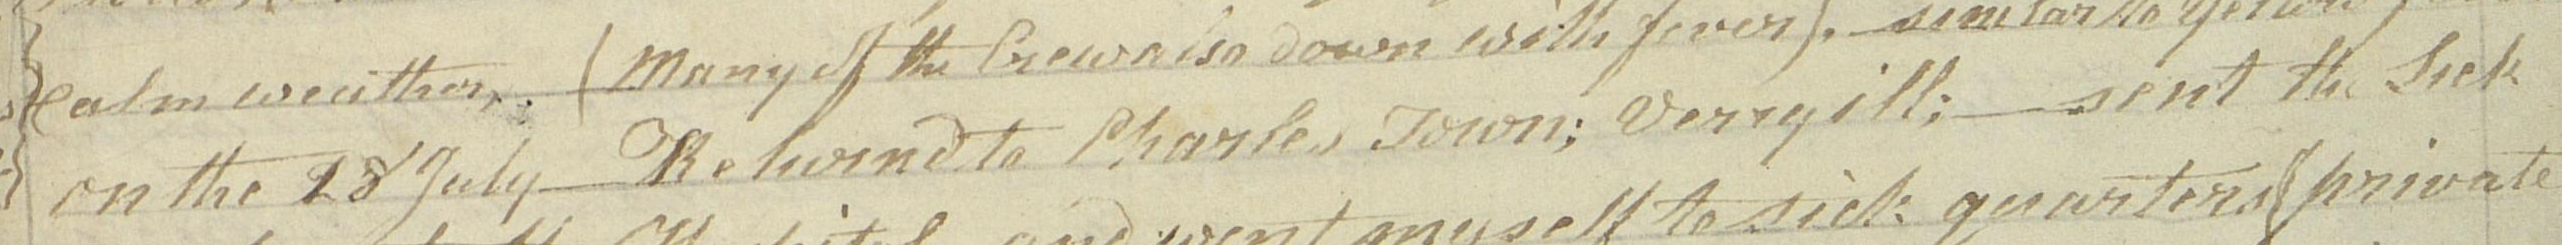on the 28 July Returnd to Charles Town; Verry ill; sent the Sick
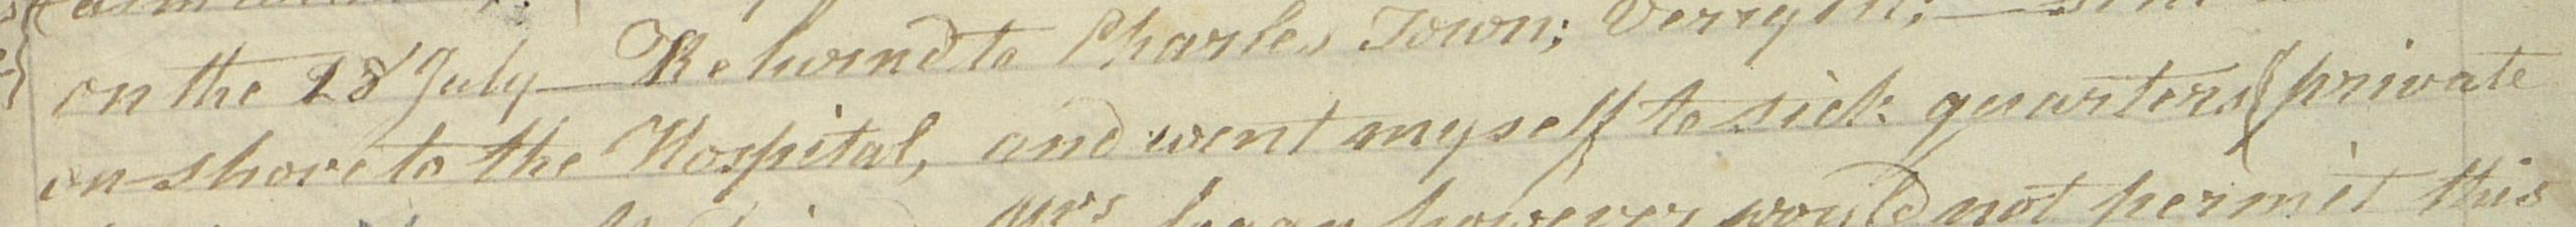on shore to the Hospital, and went myself to sick quarters (private
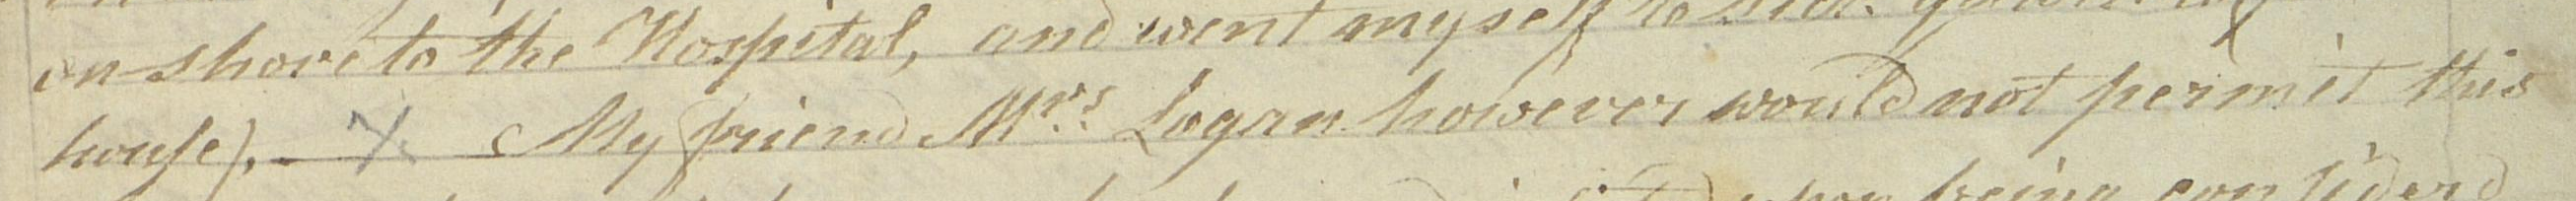house). My friend M^rs. Logan however would not permit this
